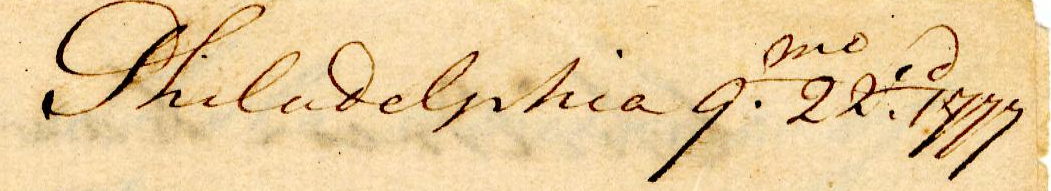Philadelphia 9.^mo 22.^nd 1777
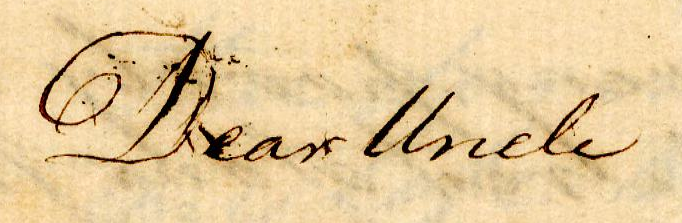Dear Uncle
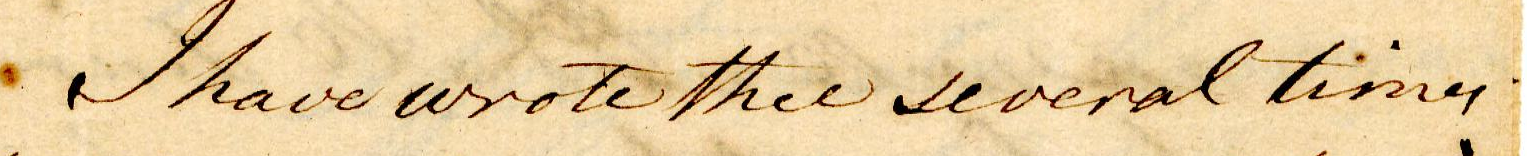I have wrote thee several times
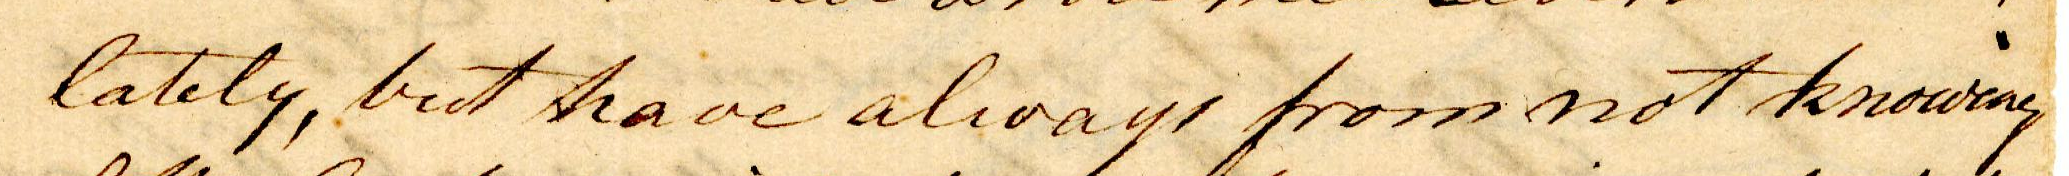lately, but have always from not knowing
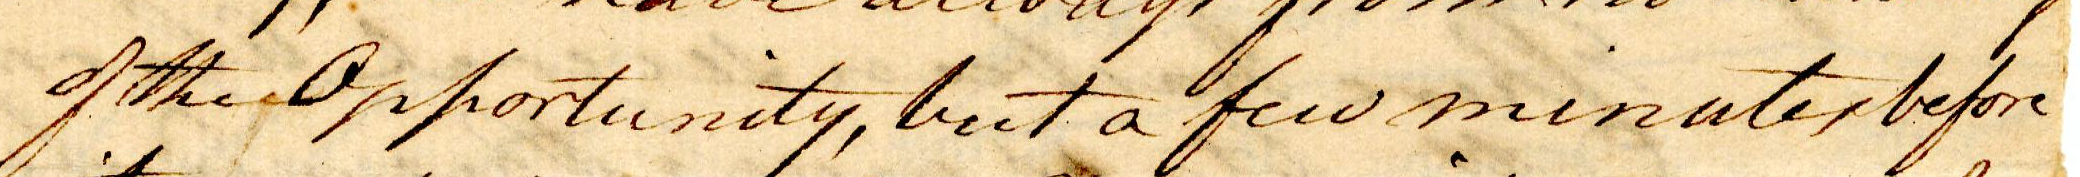of the Opportunity, but a few minutes before
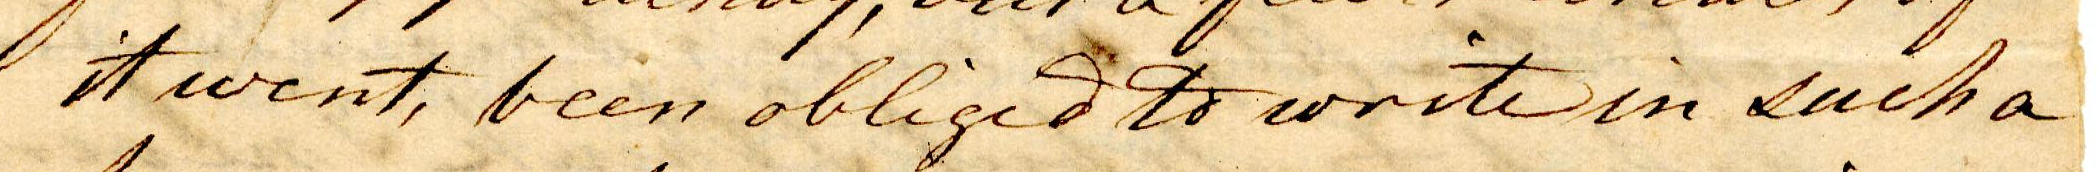it went, been obliged to write in such a
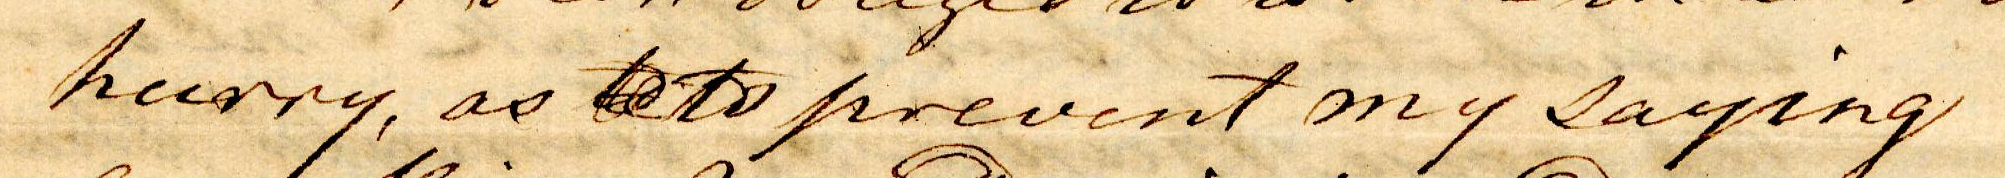hurry, as to prevent my saying
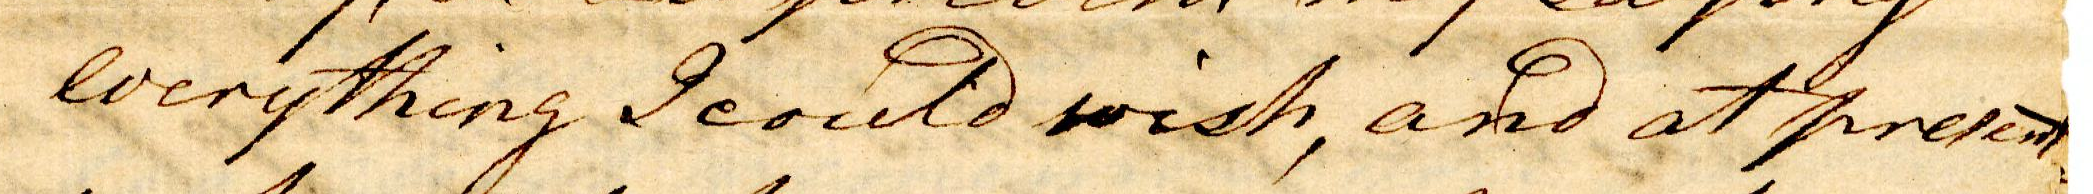everything I could wish, and at present
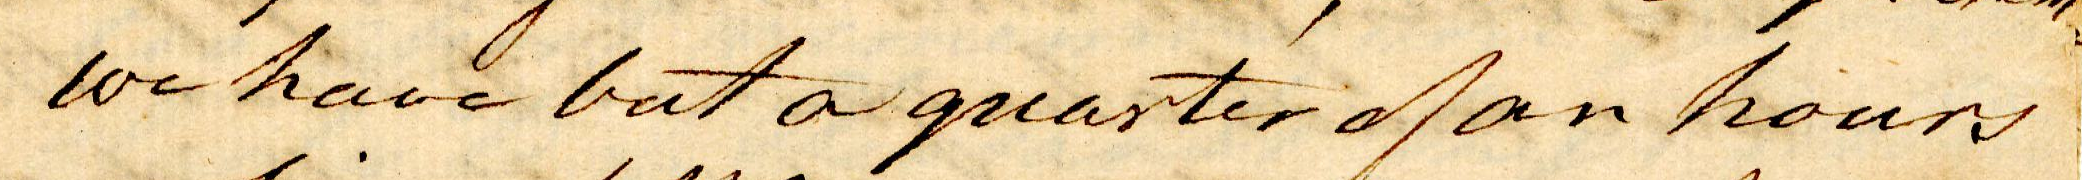we have but a quarter of an hours
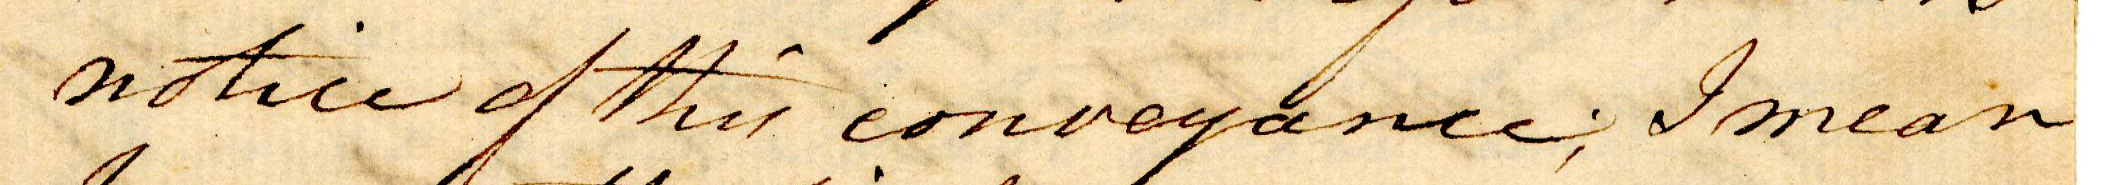notice of this conveyance; I mean
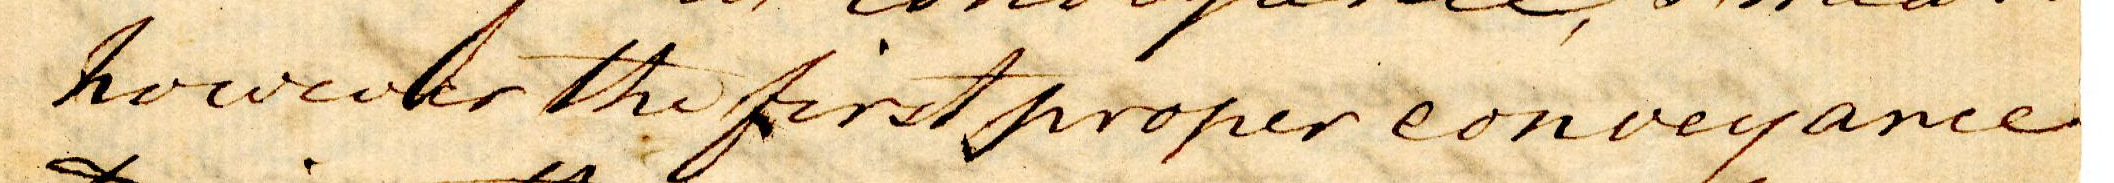however the first proper conveyance
